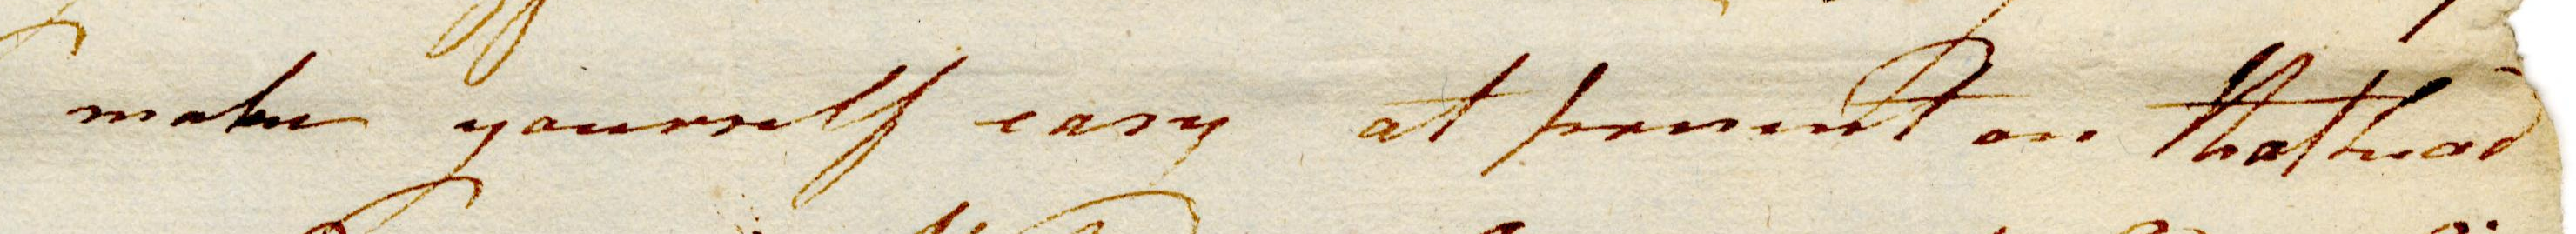make yourself easy at present on that head
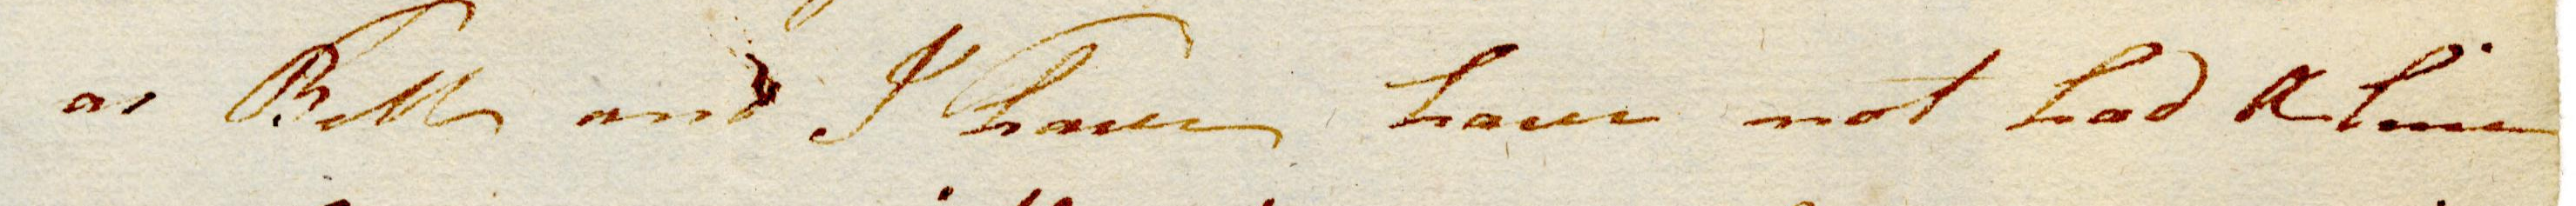as Bell and I have have not had a line
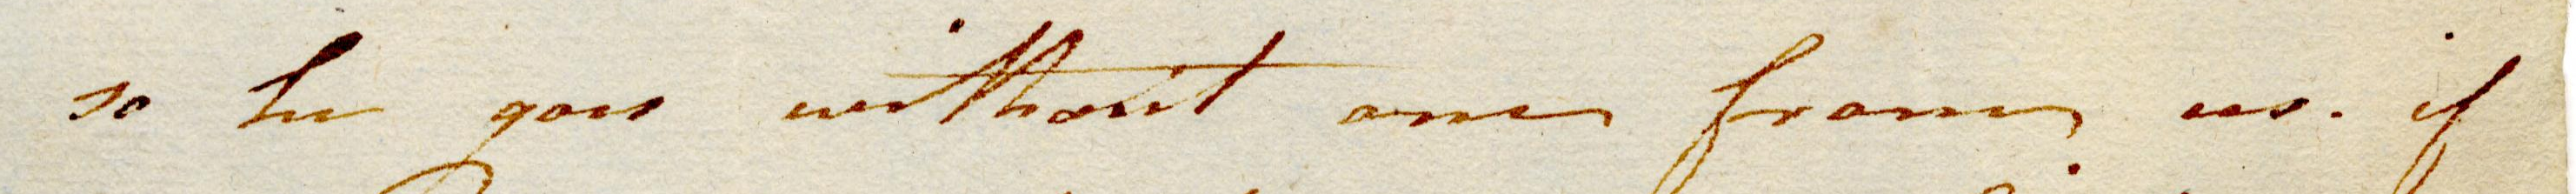so he goes without one from us. if
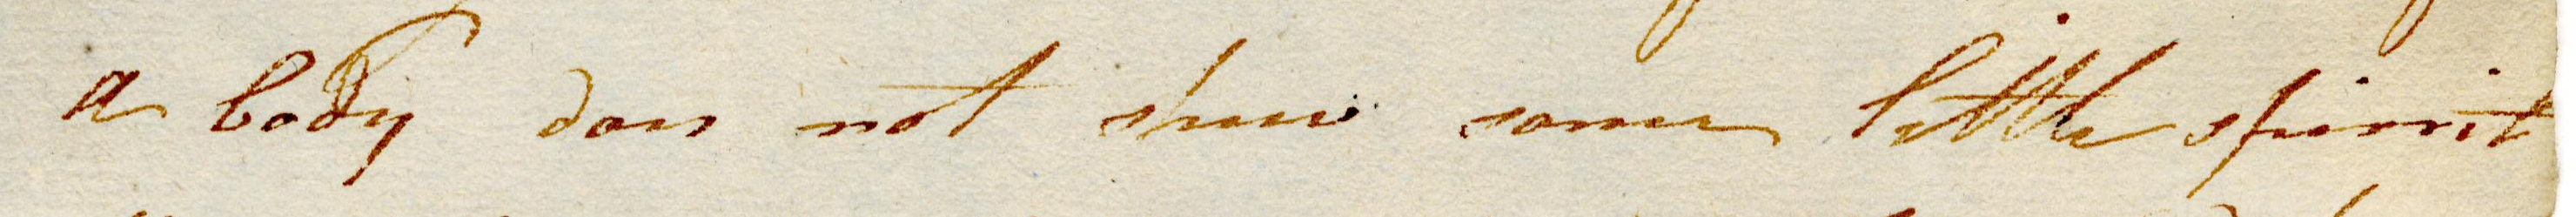a body does not shew some little spirrit
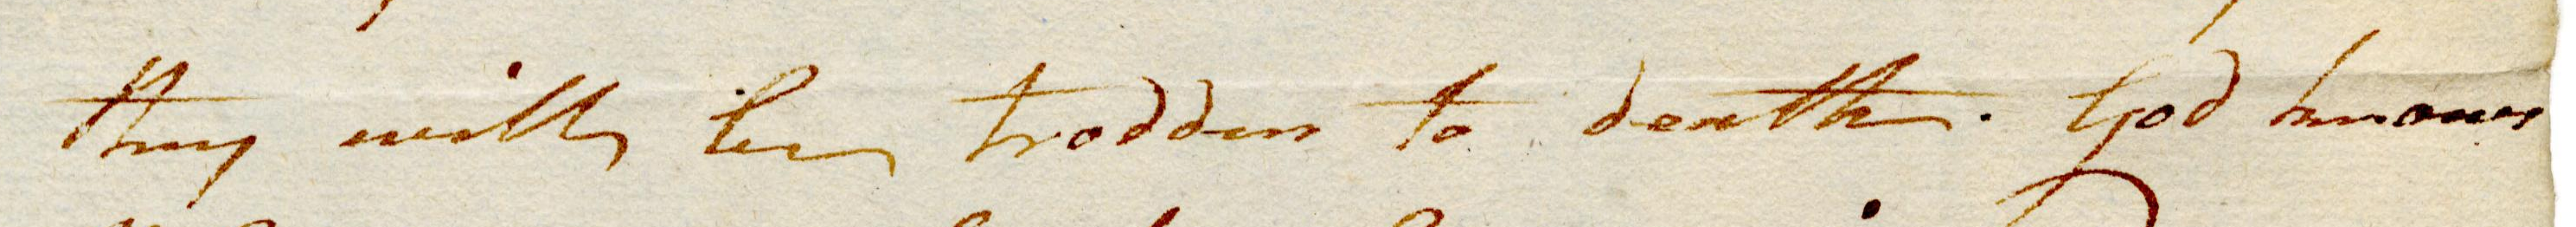they will be trodden to death. God knows
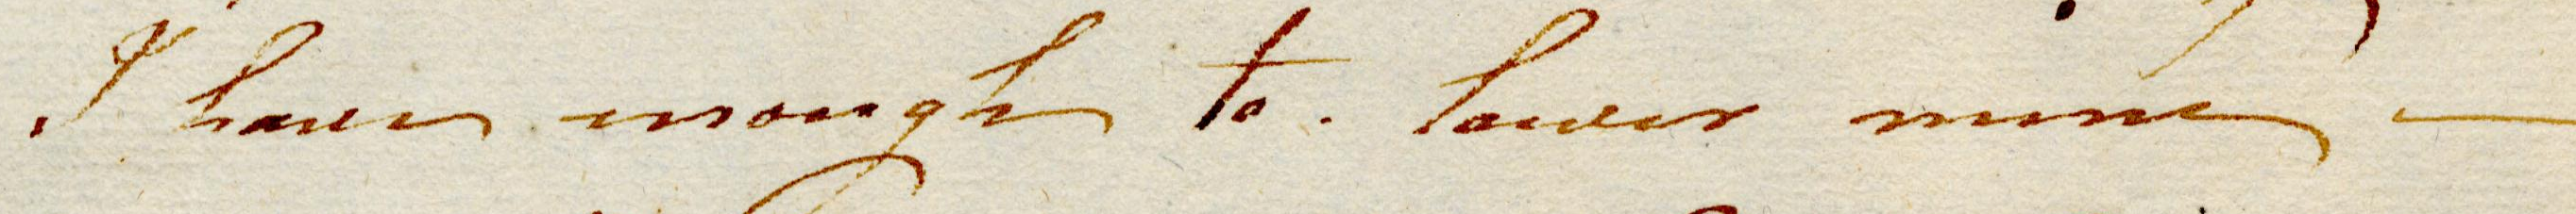I have enough to favor mine.-
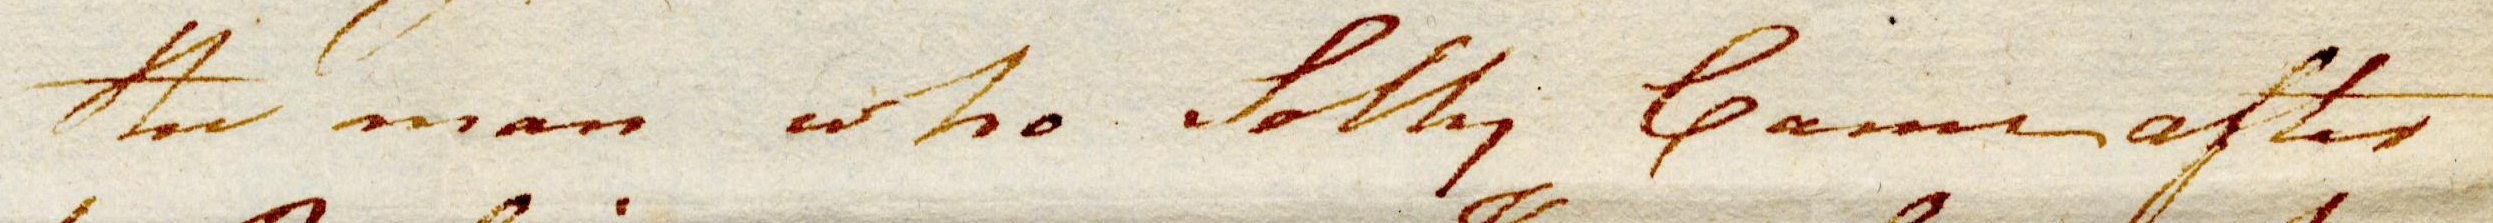the man who Sally Came after
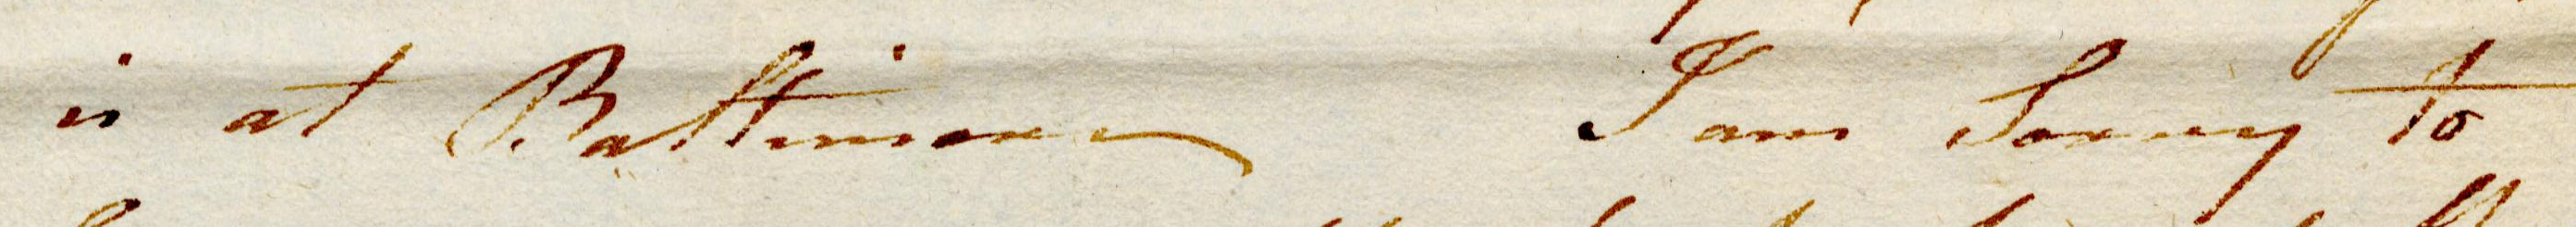is at Baltimore I am sorry to
